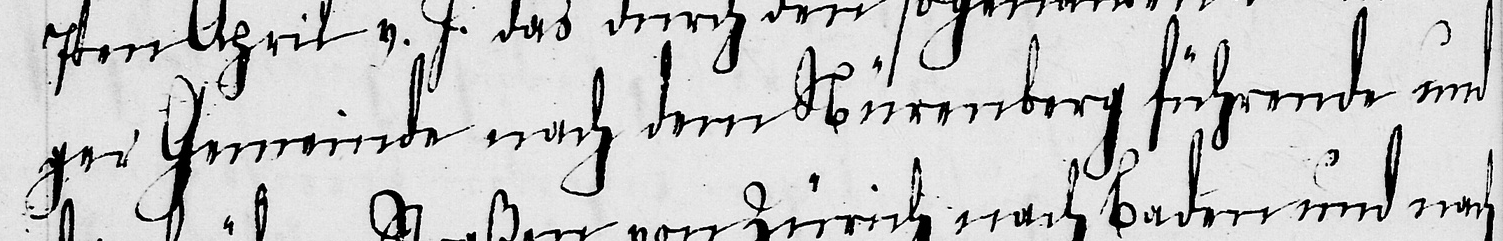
iger Gemeinde nach dem Nürenberg führende und
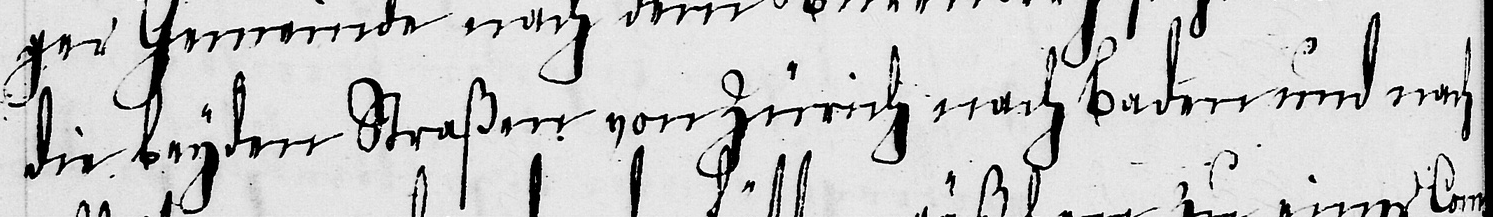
die beyden Straßen von Zürich nach Baden und nach
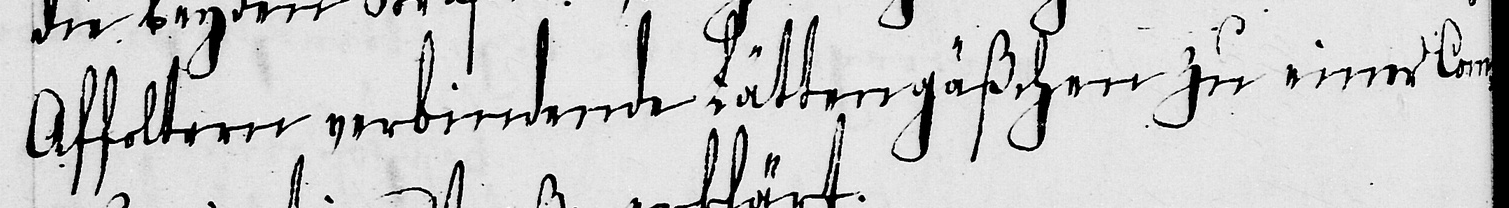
Affoltern verbindende Lättengäßchen zu einer Com¬
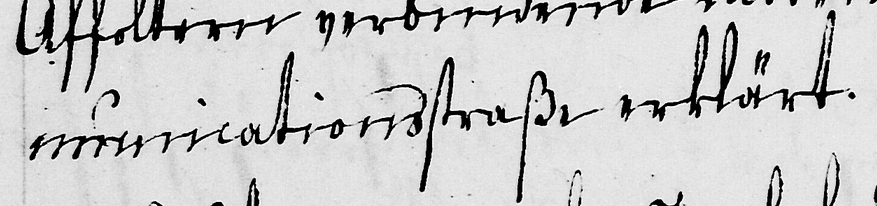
municationsstraße erklärt.
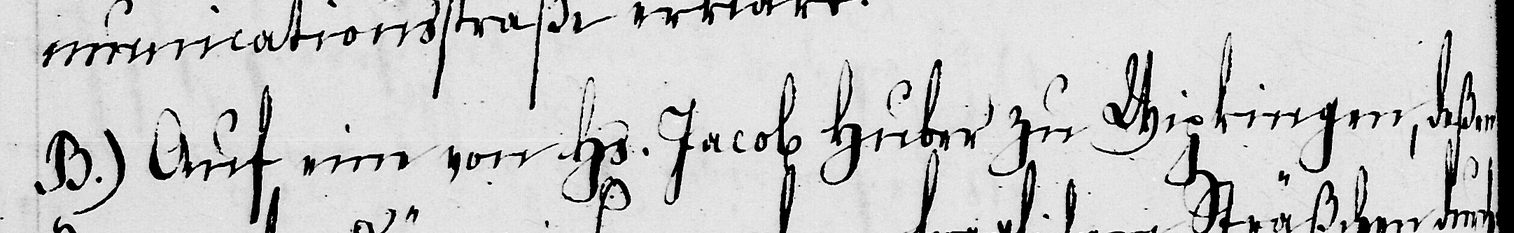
B.) Auf eine von Hs. Jacob Huber zu Wipkingen, deß¬
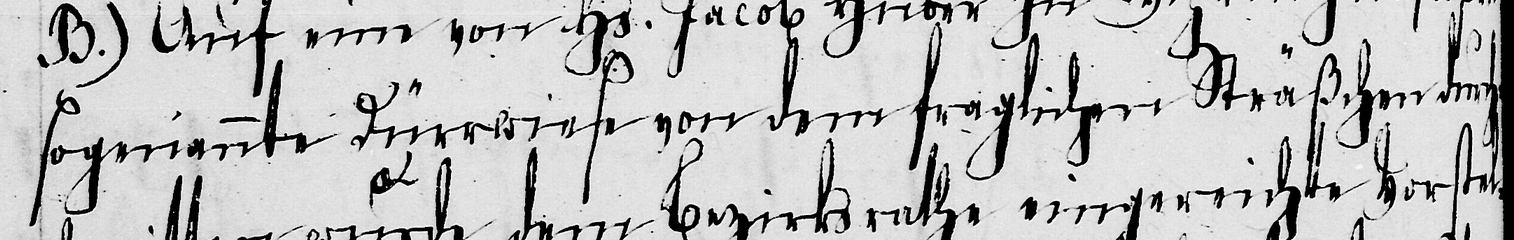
sogenannte Dürrwiese von dem fraglichen Sträßchen dur¬
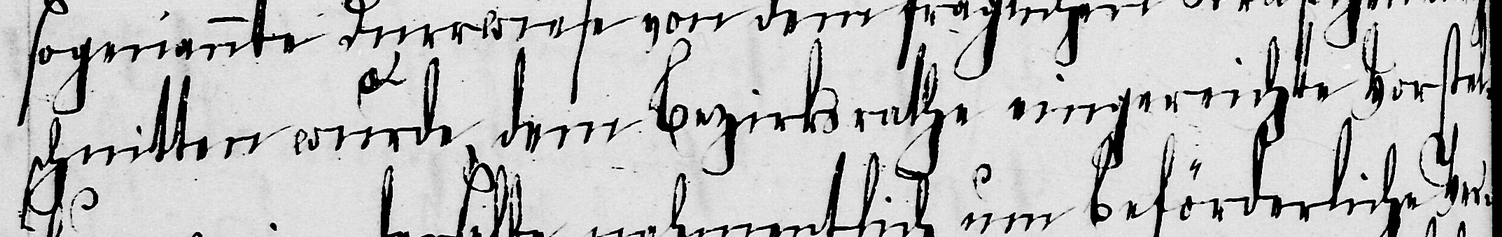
schnitten wurde dem Bezirksrathe eingereichte Vorste¬
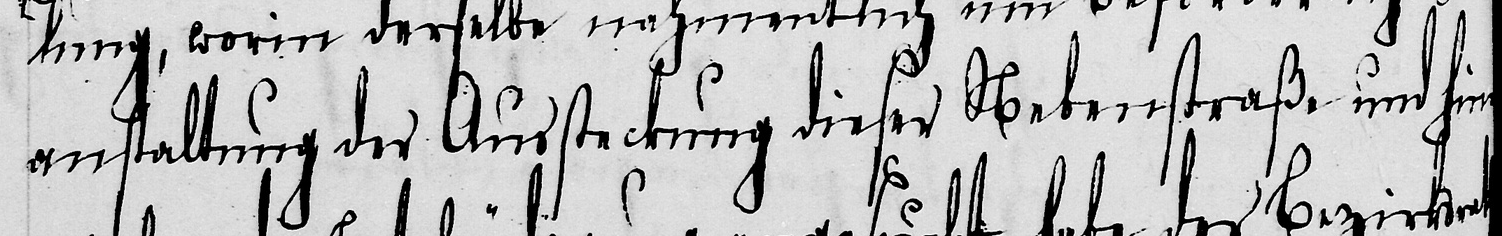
ranstaltung der Aussteckung dieser Nebenstraße und hi¬
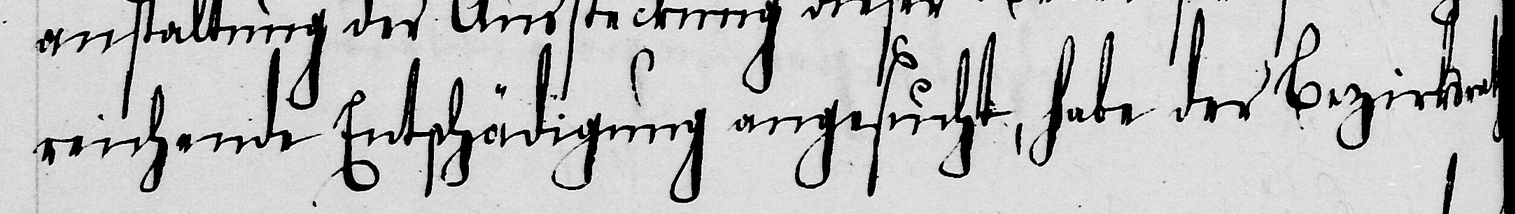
nreichende Entschädigung angesucht, habe der Bezirks¬
